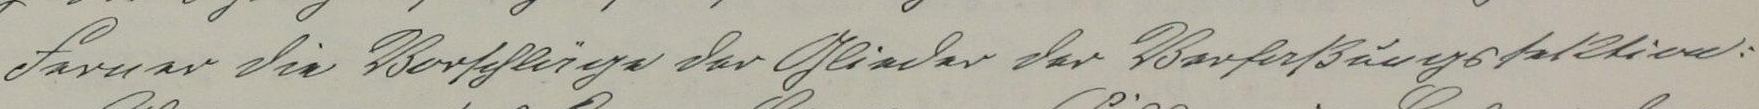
Ferner die Vorschläge der Glieder der Verfaßungssektion.
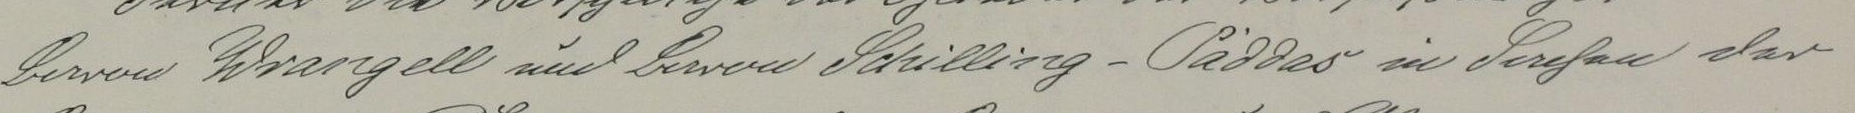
Baron Wrangell und Baron Schilling-Paddas in Sachen der
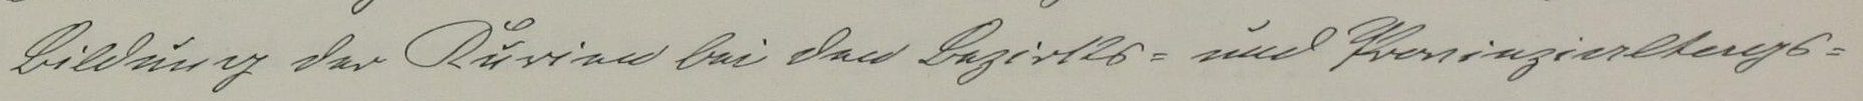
Bildung der Kurien bei den Bezirks- und Provinzialtags-
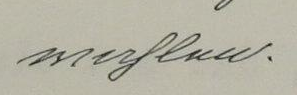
wahlen.
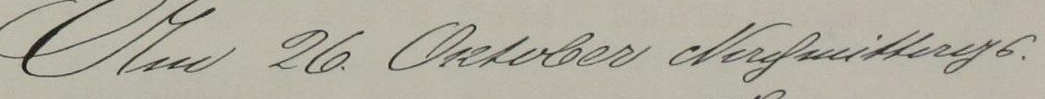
Am 26. Oktober Nachmittags.
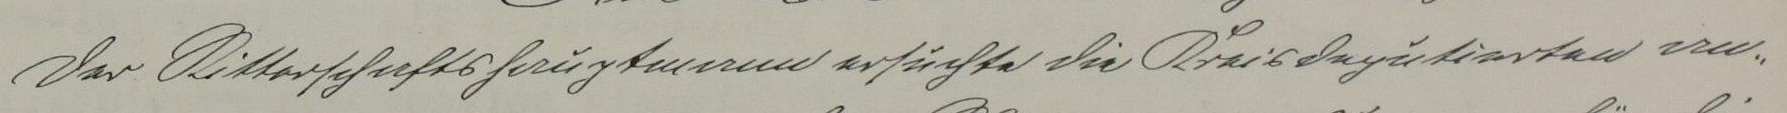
Der Ritterschaftshauptmann ersuchte die Kreisdeputierten an-
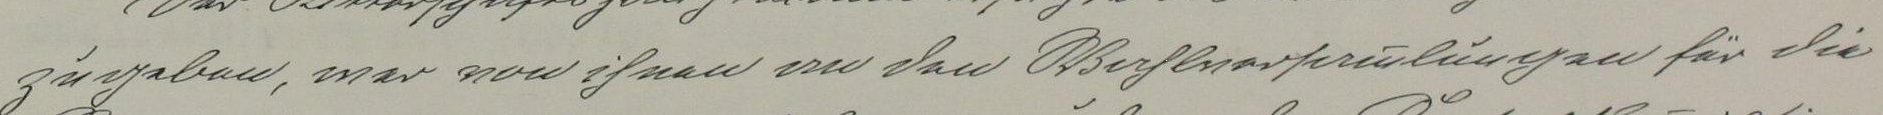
zugeben, wer von ihnen an den Wahlversammlungen für die
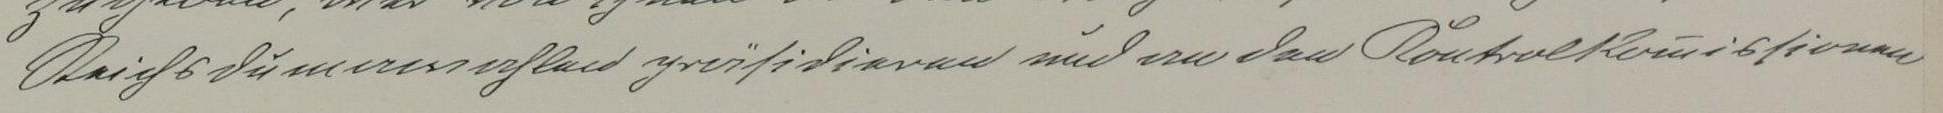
Reichsdumawahlen präsidieren und an den Kontrollkommissionen
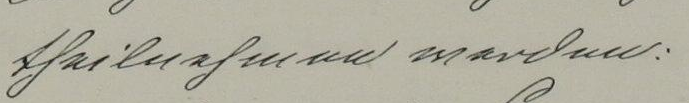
theilnehmen werde.
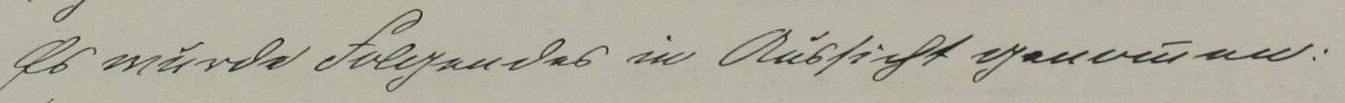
Es wurde Folgendes in Aussicht genommen:
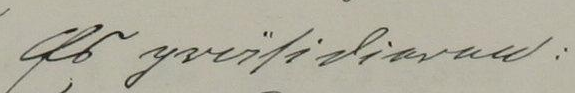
Es präsidieren:
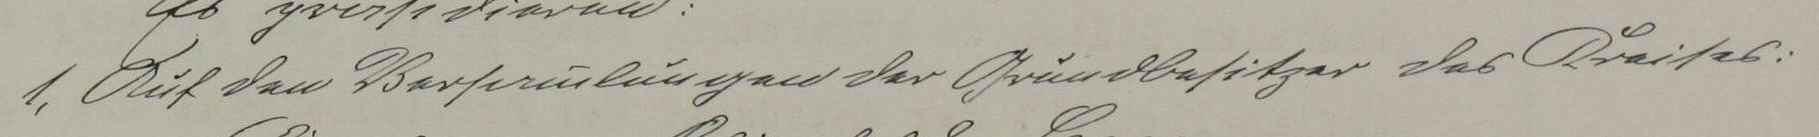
1. Auf den Versammlungen der Grundbesitzer des Kreises:
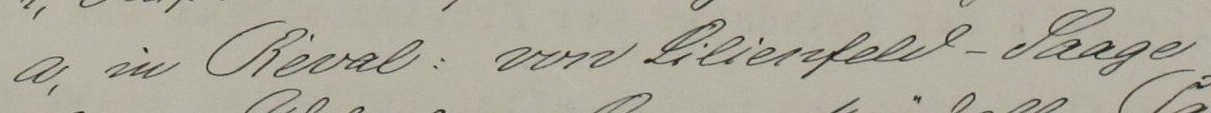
a. in Reval: von Lilienfeld-Saage
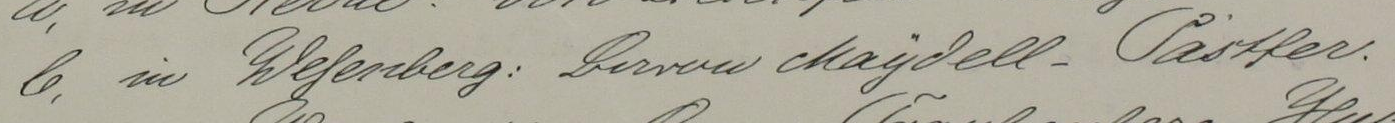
b. in Wesenberg: Baron Maydell-Pastfer.
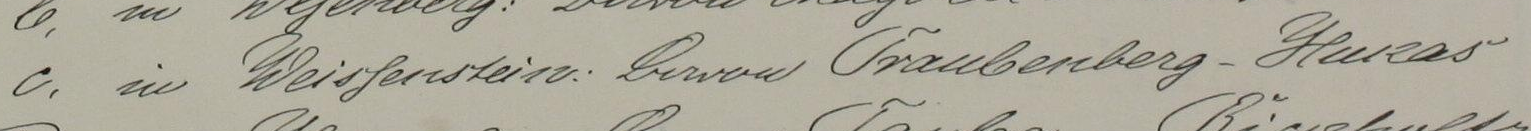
c. in Weissenstein: Baron Traubenberg-Hukas
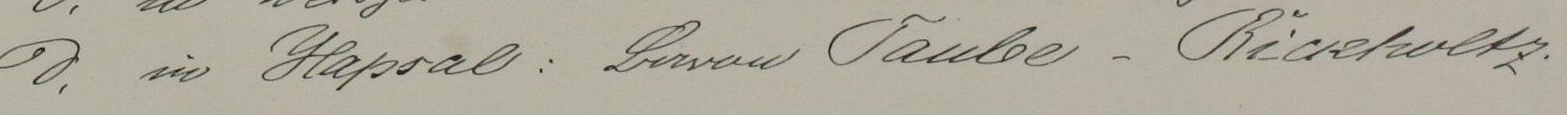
d. in Hapsal: Baron Taube-Rickholtz.
